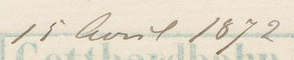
15 Avril 1872
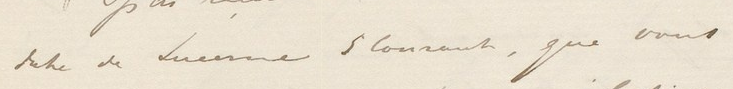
date de Lucerne5 Courant, que vous
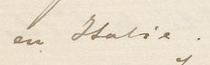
en Italie .
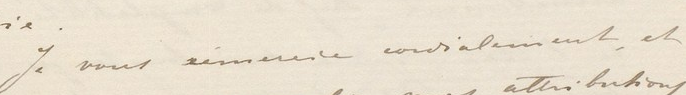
Je vous rémercie cordialement, et
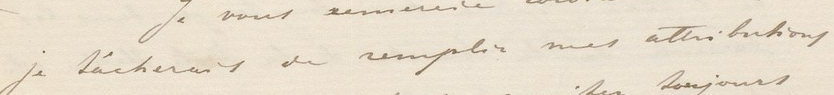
je tâcherais de remplir mes attributions
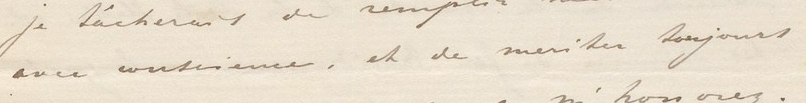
avec conscience, et de meriter toujours
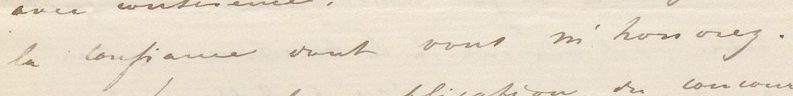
la confiance dont vous m'honorez.
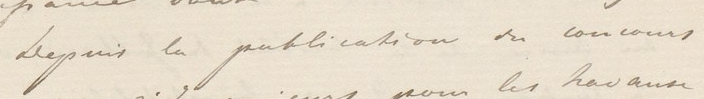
Depuis la publication du concours
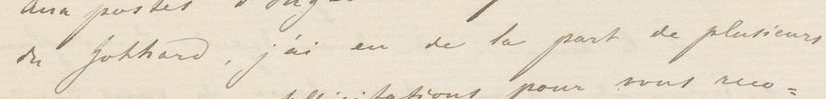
du Gothard, j'ai eu de la part de plusieurs
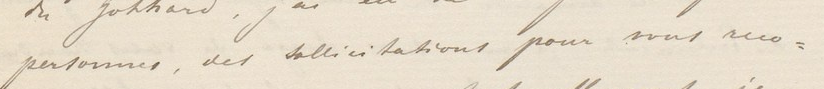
personnes, des sollicitations pour vous reco-
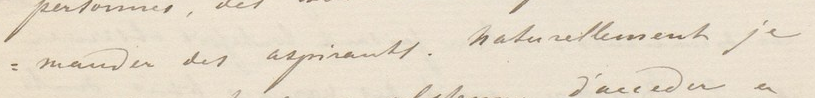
mander des aspirants. Naturellement je
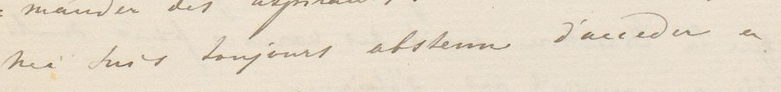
me suis toujours abstenu d'acceder a
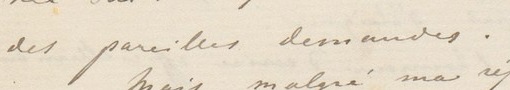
des pareilles demandes.
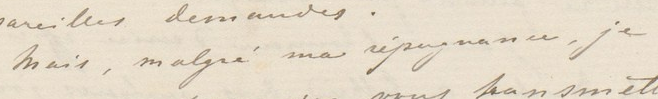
Mais, malgré ma répugnance, je
